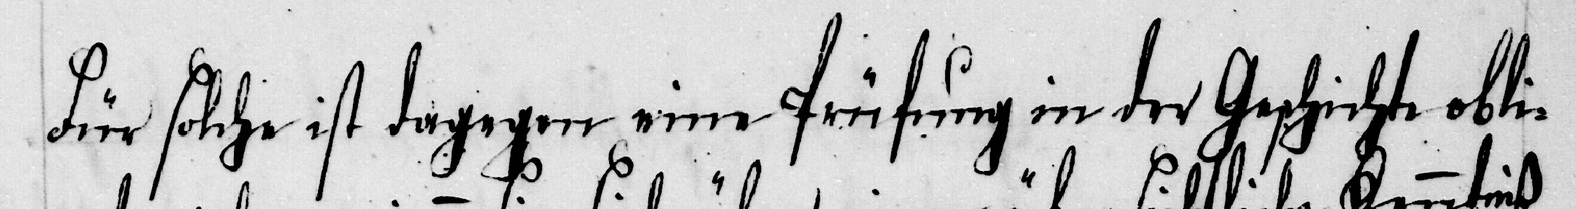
Für solche ist dagegen eine Prüfung in der Geschichte obli¬
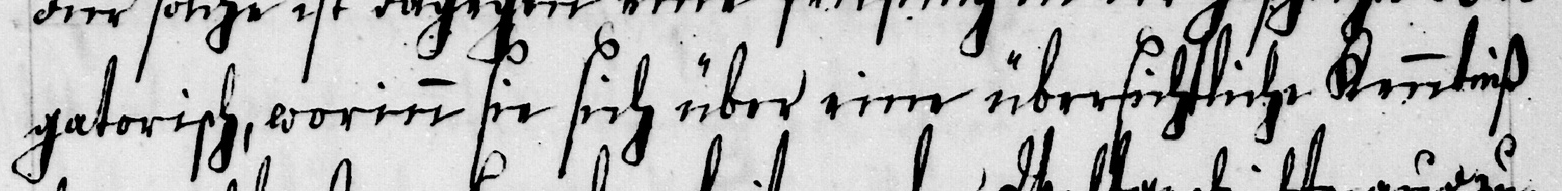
gatorisch, worinn sie sich über eine übersichtliche Kenntniß
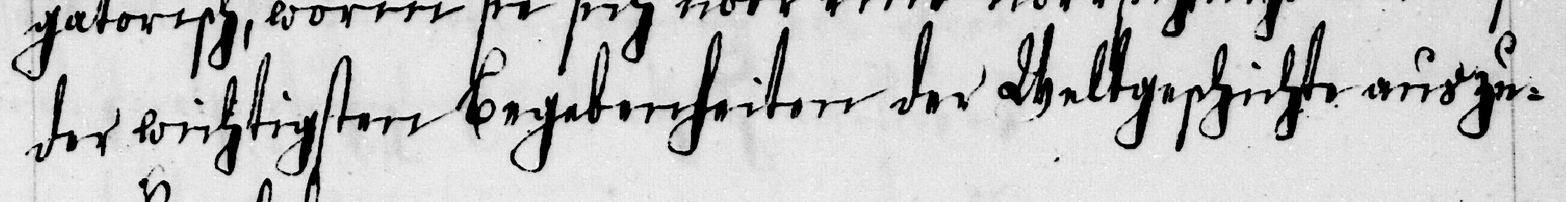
der wichtigsten Begebenheiten der Weltgeschichte auszu¬
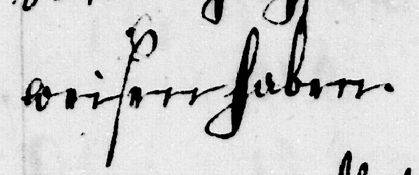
weisen haben.
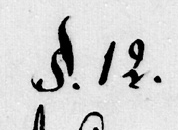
§. 12.
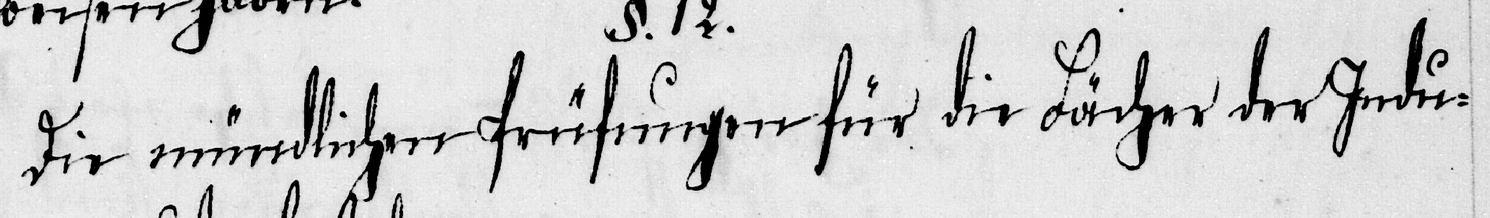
Die mündlichen Prüfungen für die Fächer der Indu¬
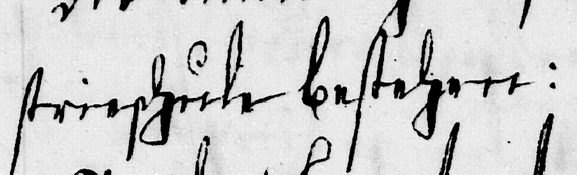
strieschule bestehen:
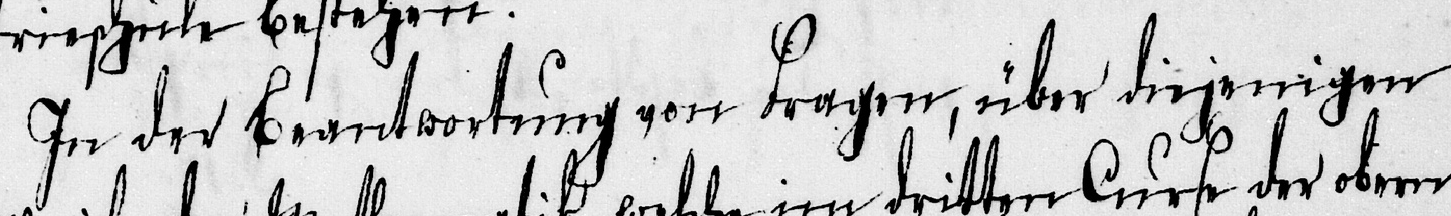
In der Beantwortung von Fragen, über diejenigen
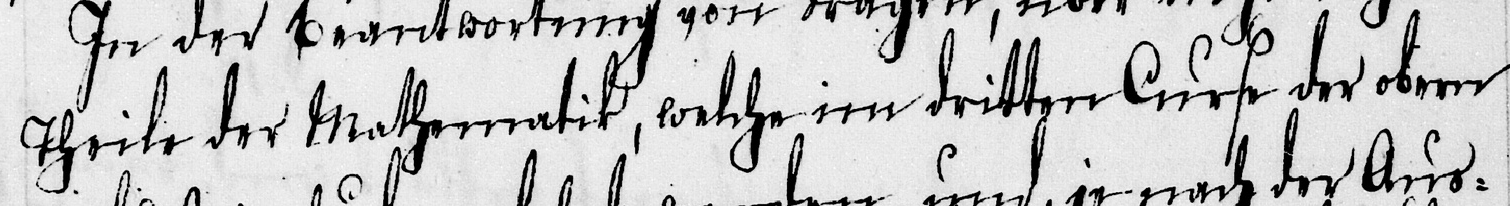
Theile der Mathematik, welche im dritten Curse der obern
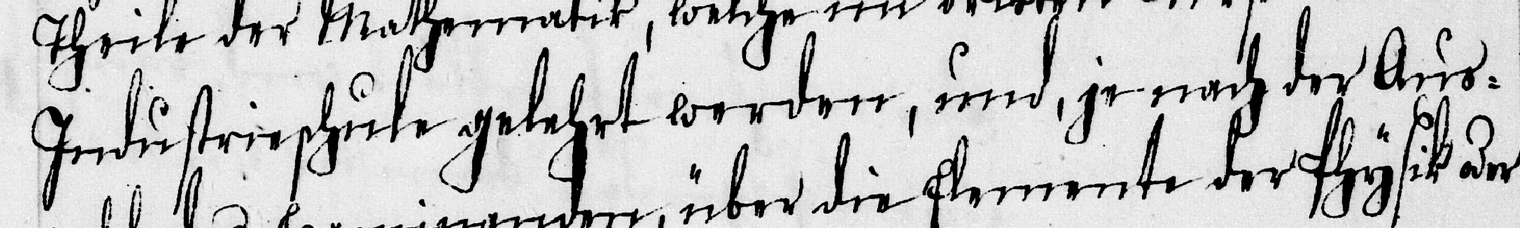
Industrieschule gelehrt werden, und, je nach der Aus¬
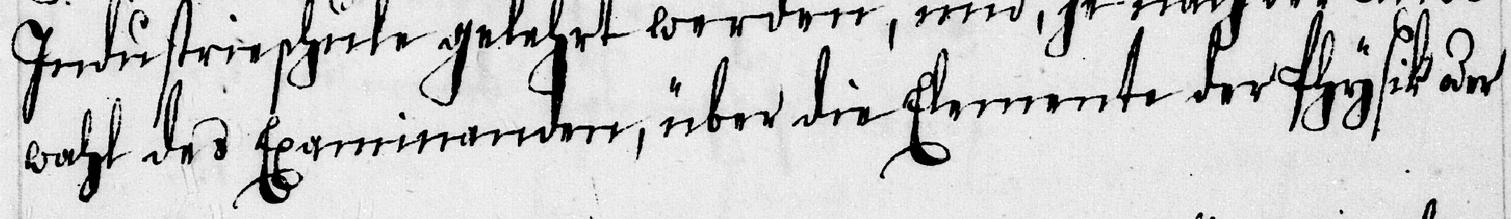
wahl des Examinanden, über die Elemente der Physik od¬
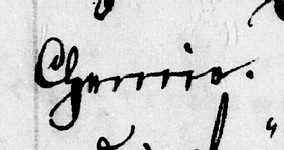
Chemie.
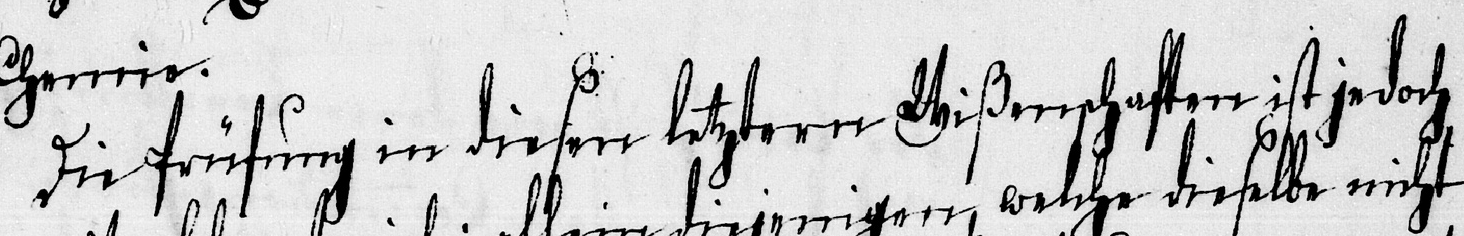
Die Prüfung in diesen letztern Wißenschaften ist jedo¬
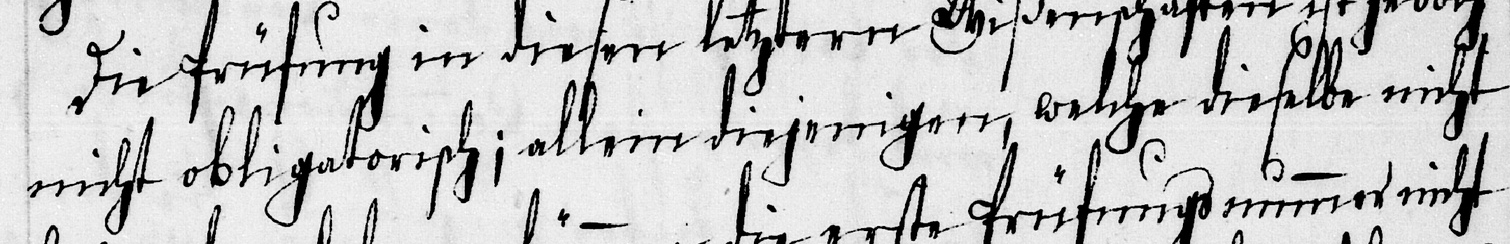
nicht obligatorisch; allein diejenigen, welche dieselbe nicht
